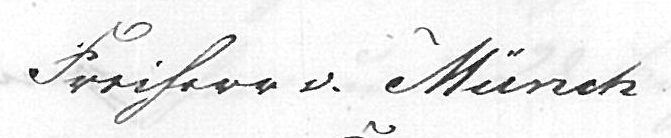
Freiherr v. Münch
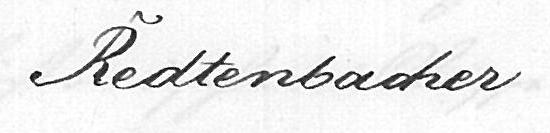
Redtenbacher
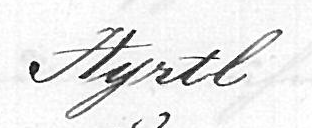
Hyrtl
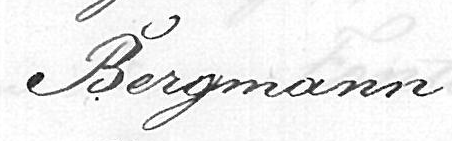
Bergmann
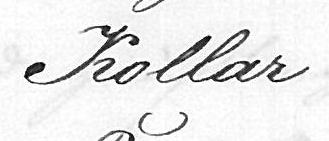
Kollar
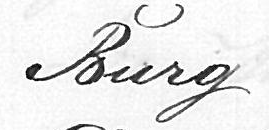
Burg
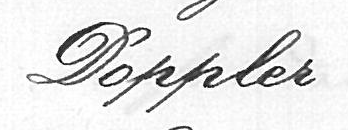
Doppler
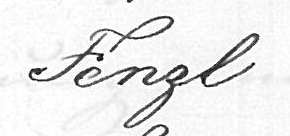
Fenzl
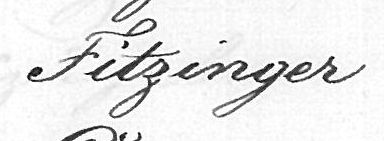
Fitzinger
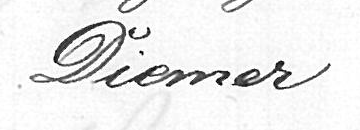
Diemer
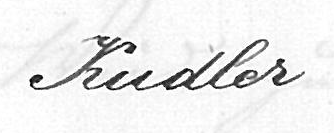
Kudler
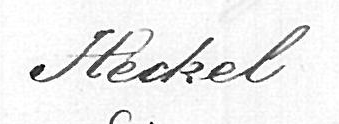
Heckel
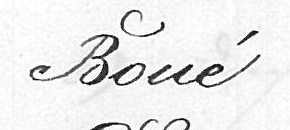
Boué
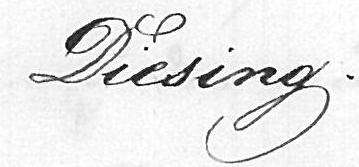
Diesing
